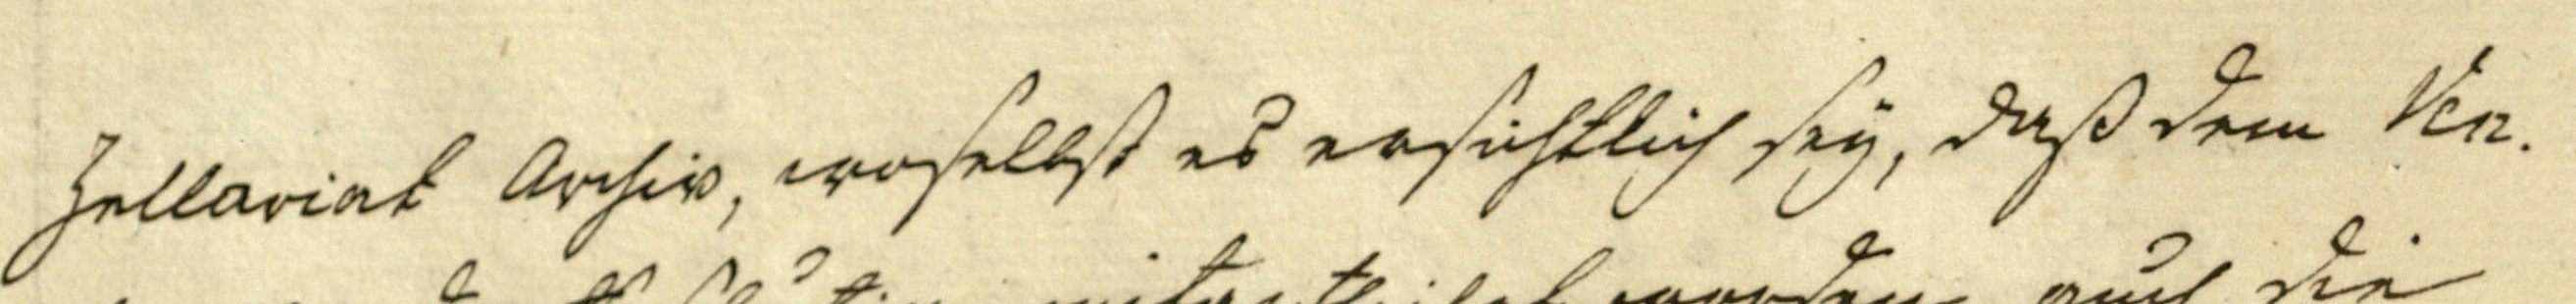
zellariat Archiv, woselbst es ersichtlich seÿ, daß dem Ven.
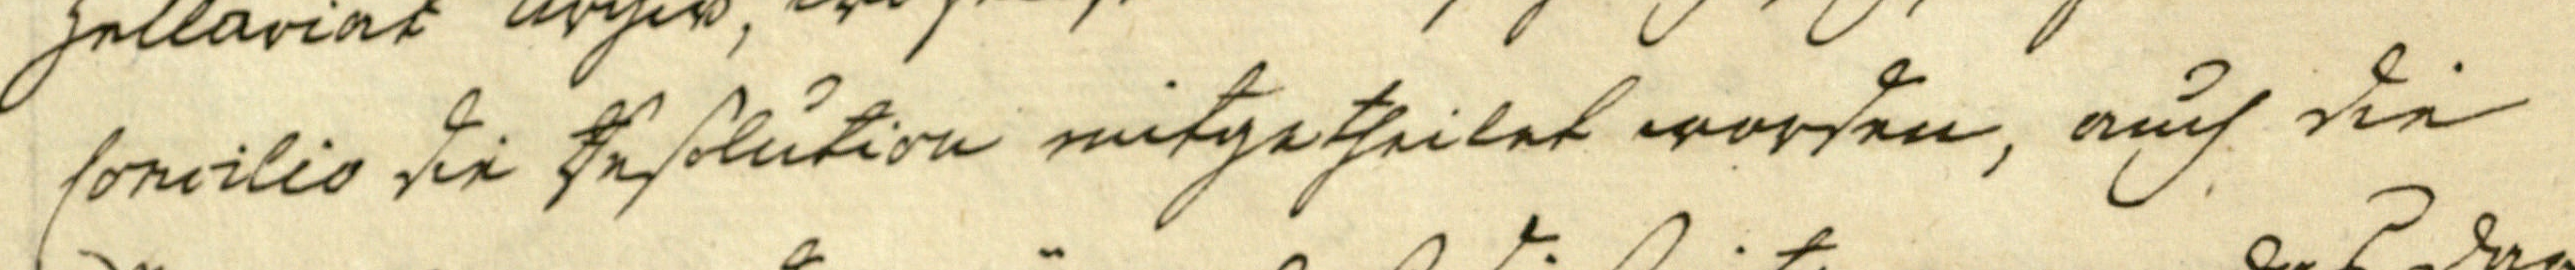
Concilio die Resolution mitgetheilet worden, auch die
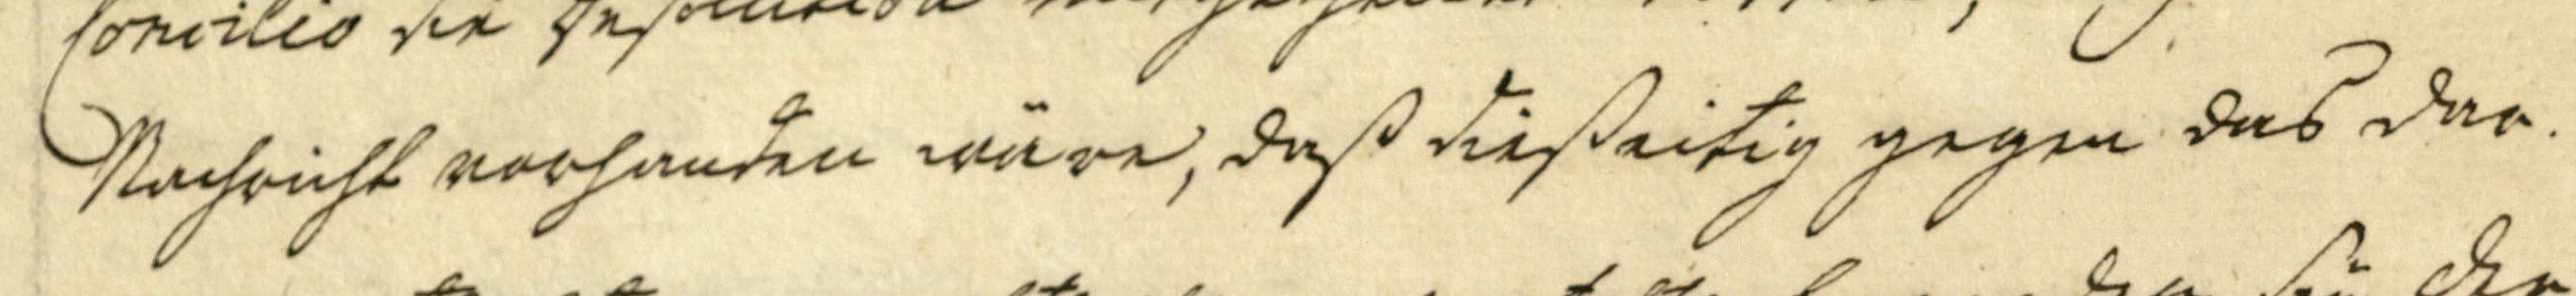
Nachricht vorhanden wäre, daß diesseitig gegen das dar¬
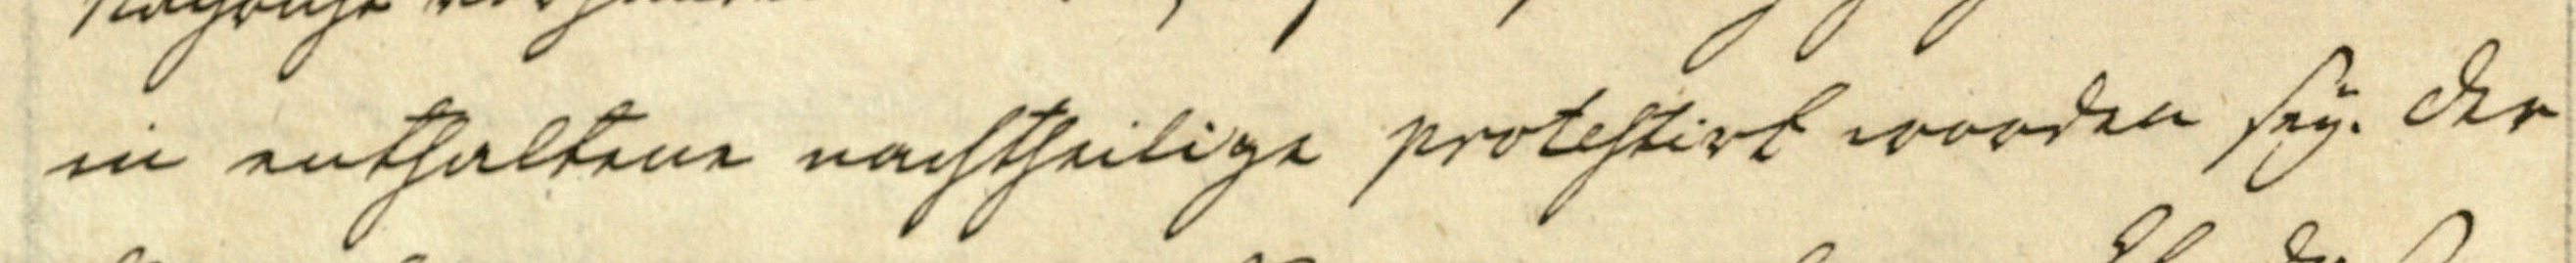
in enthaltene nachtheilige protestirt worden seÿ. Der
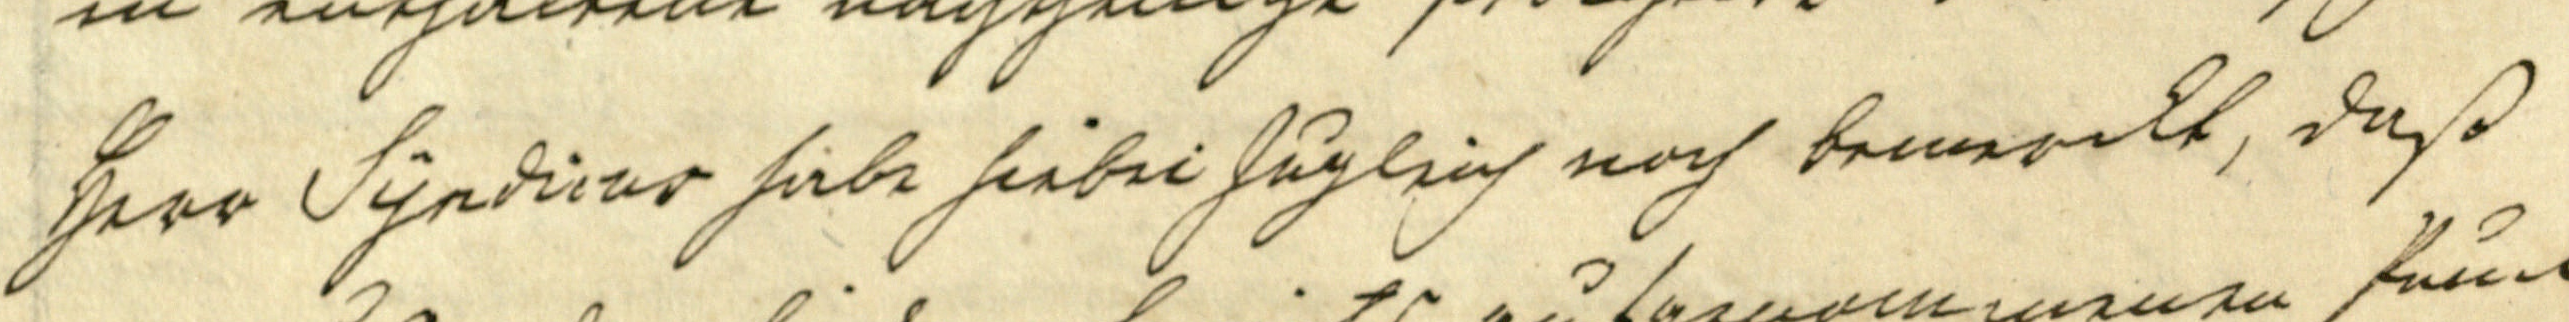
Herr Sÿndicus habe hiebei zugleich noch bemerckt, daß
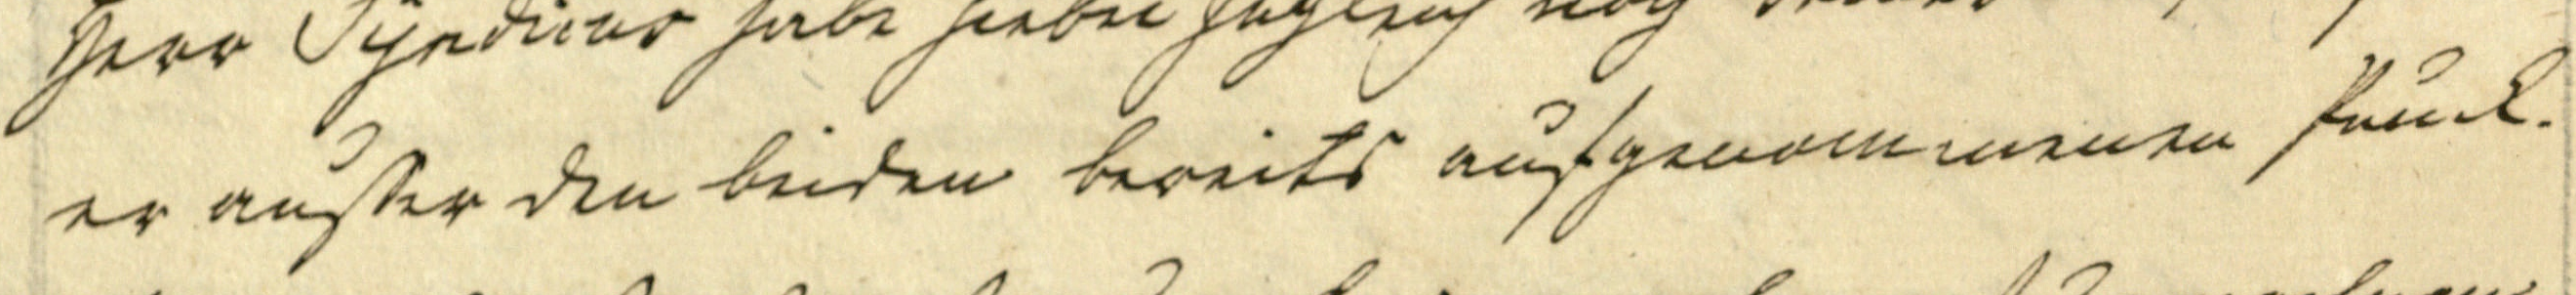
er ausser den beiden bereits aufgenommenen Punck¬
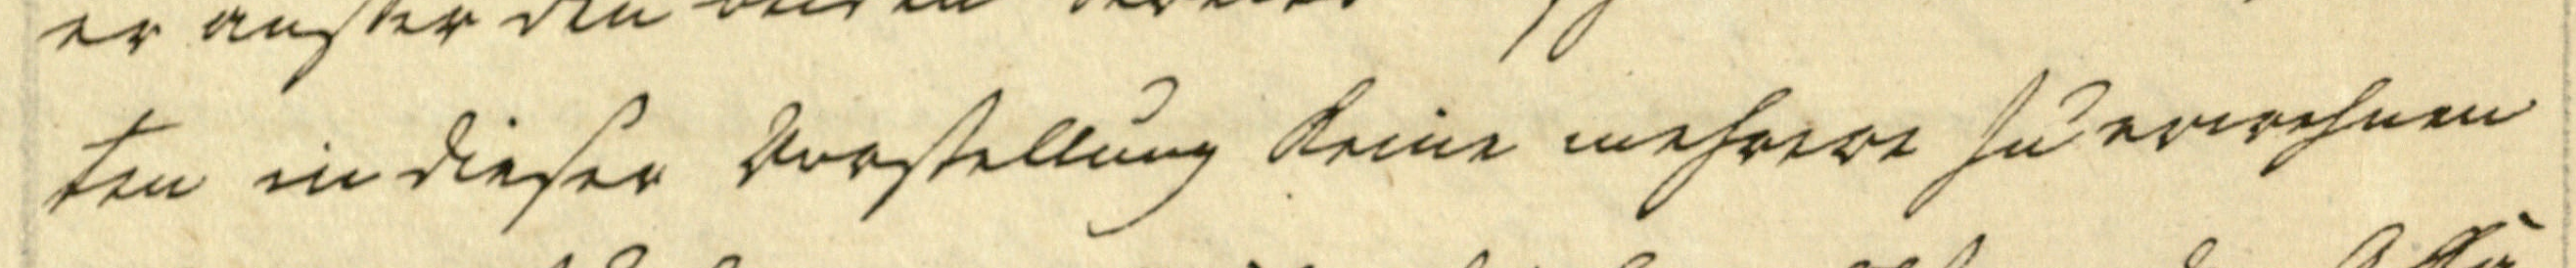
ten in dieser Vorstellung keine mehrere zu erwehnen
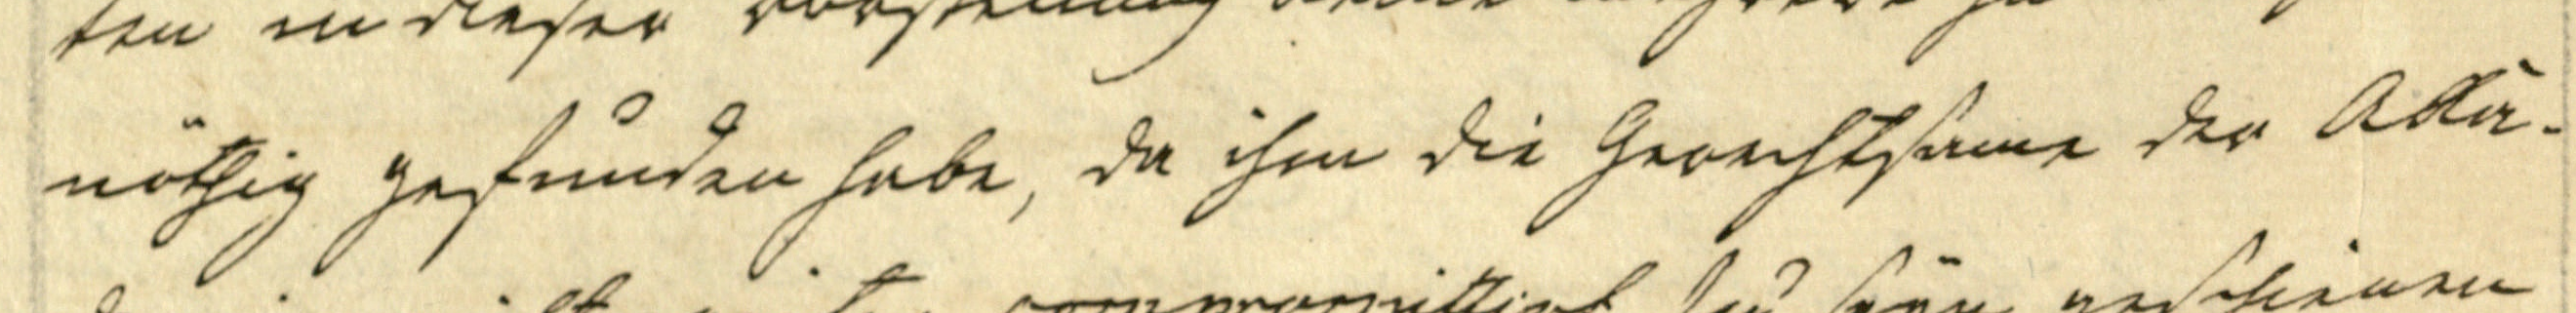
nöthig gefunden habe, da ihm die Gerechtsahme der Aka¬
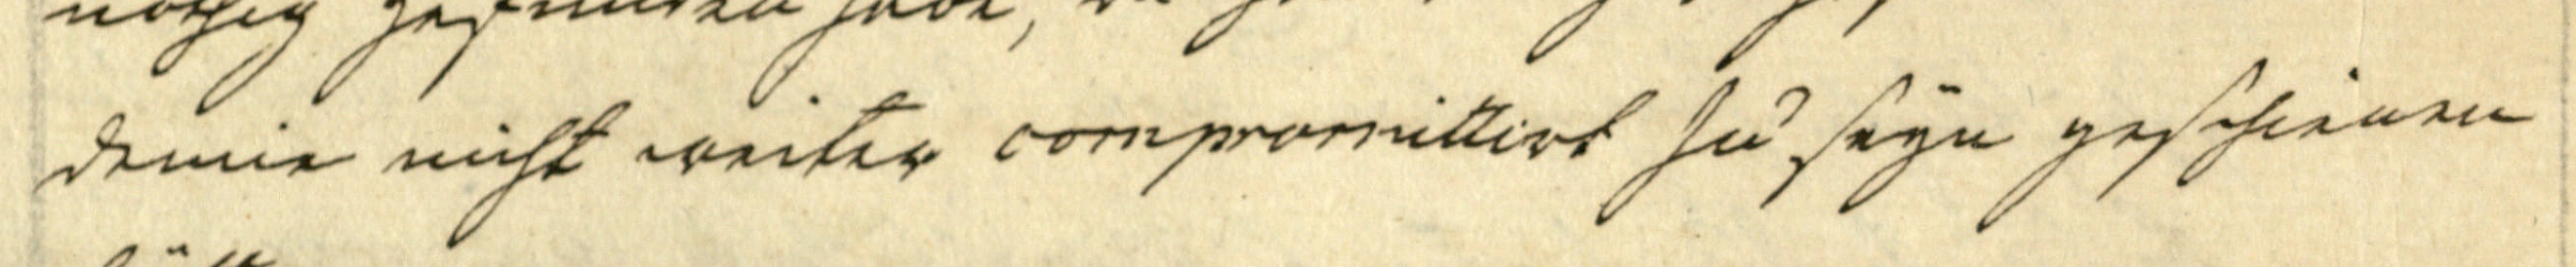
demie nicht weiter compromittirt zu seÿn geschienen
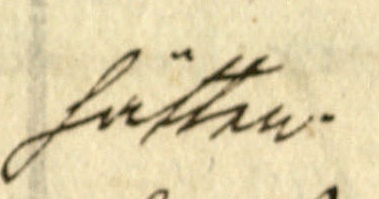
hätten.
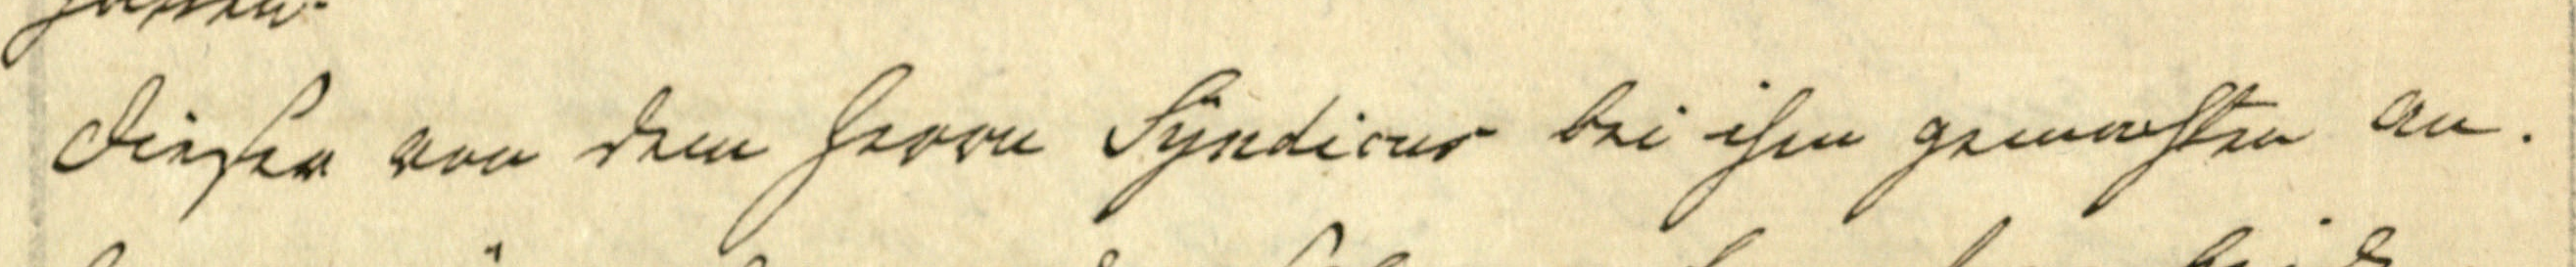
Dieser von dem Herrn Sÿndicus bei ihm gemachten An¬
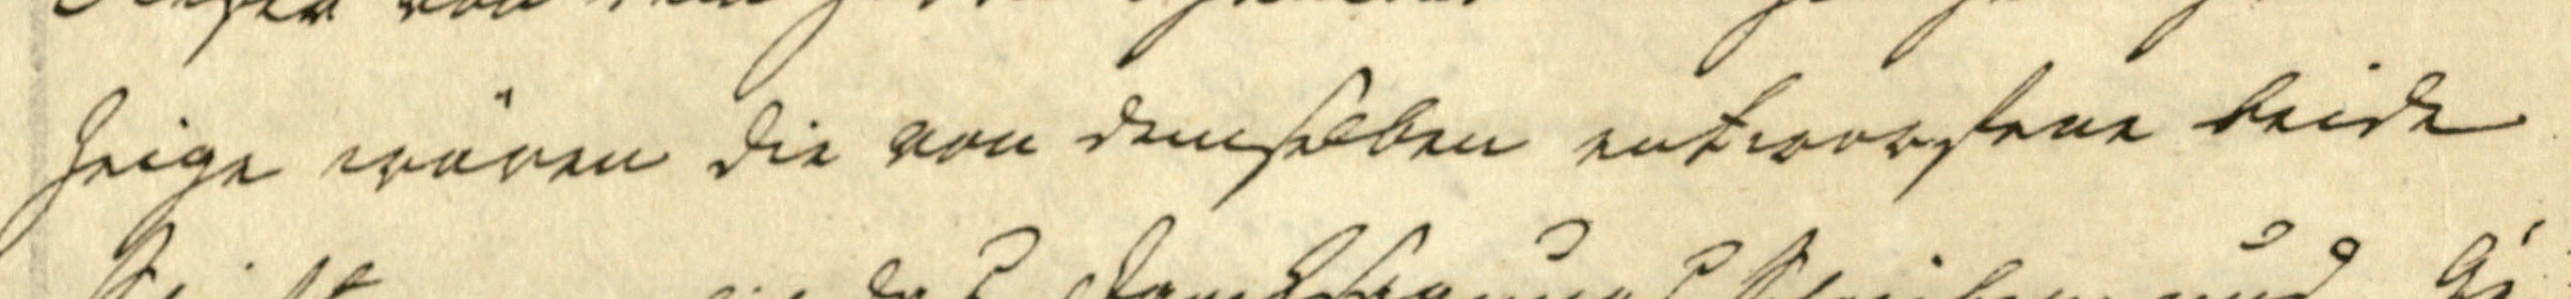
zeige wären die von demselben entworfene beide
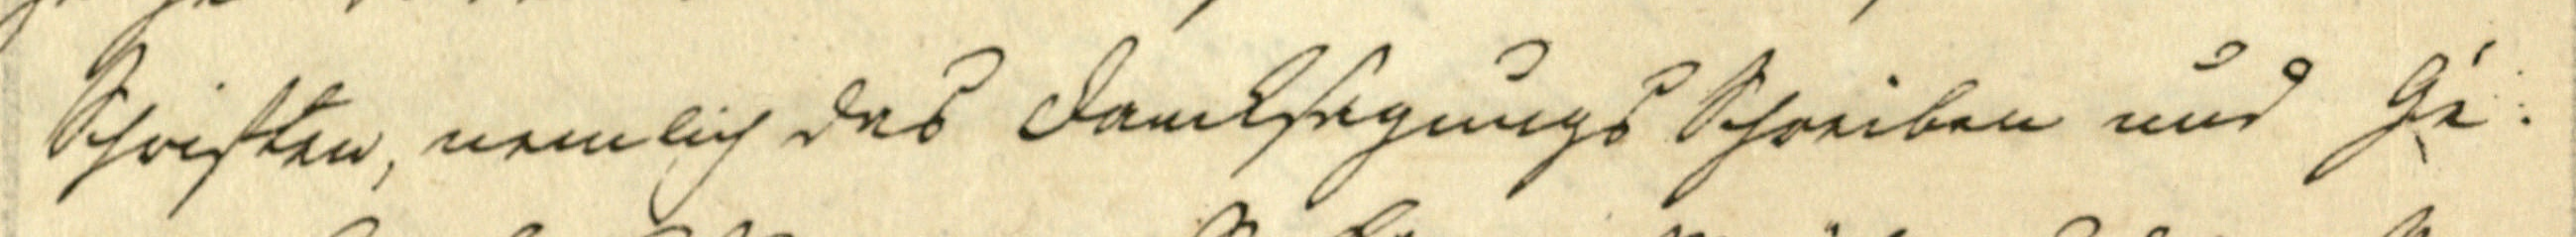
Schriften, nemlich das Dancksagungs Schreiben und Ge¬
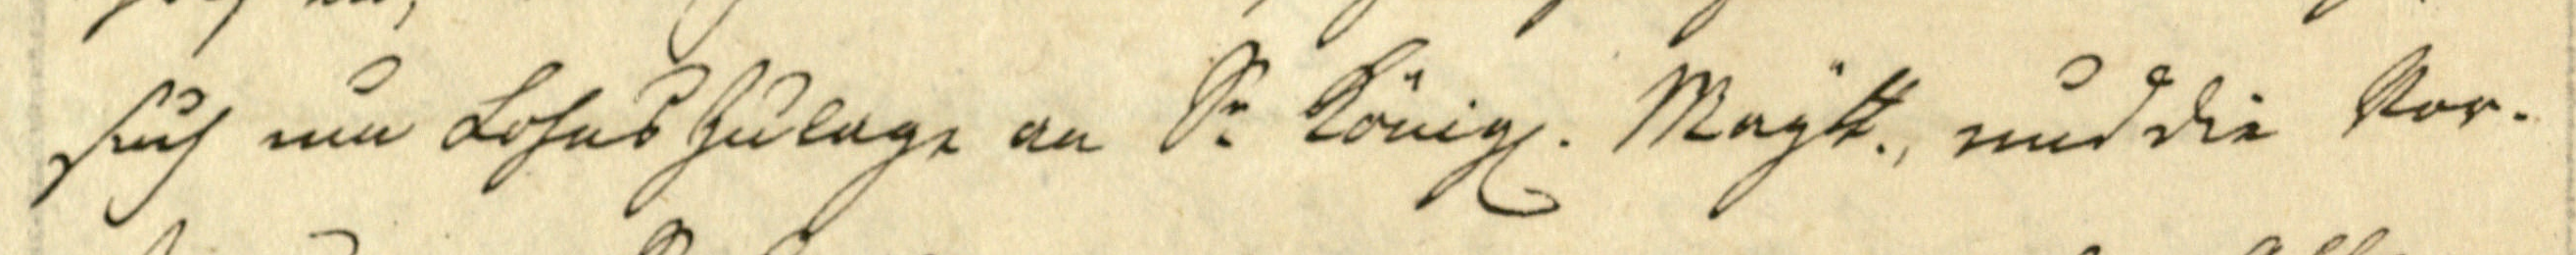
such um Lohns Zulage an Sr. Königl. Maÿtt., und die Vor¬
